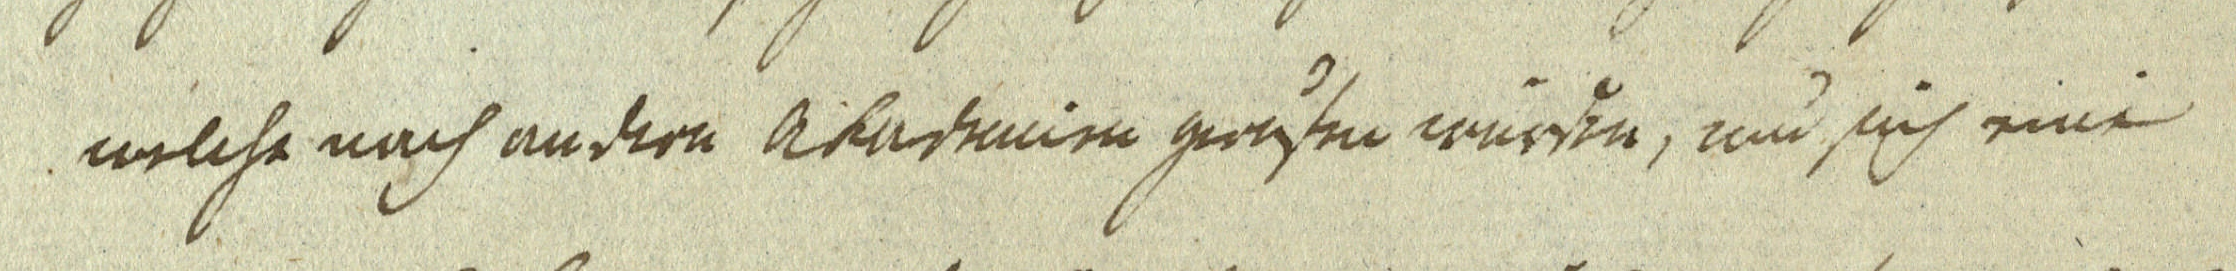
welche nach andern Akademien gerufen würden, um sich eine
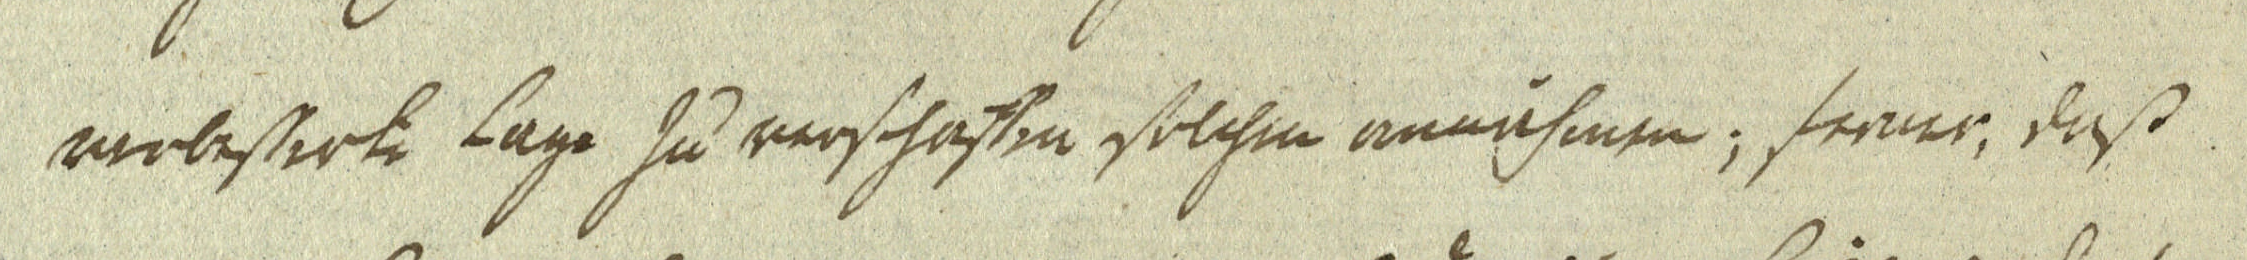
verbesserte Lage zu verschaffen solchen annähmen; ferner, daß
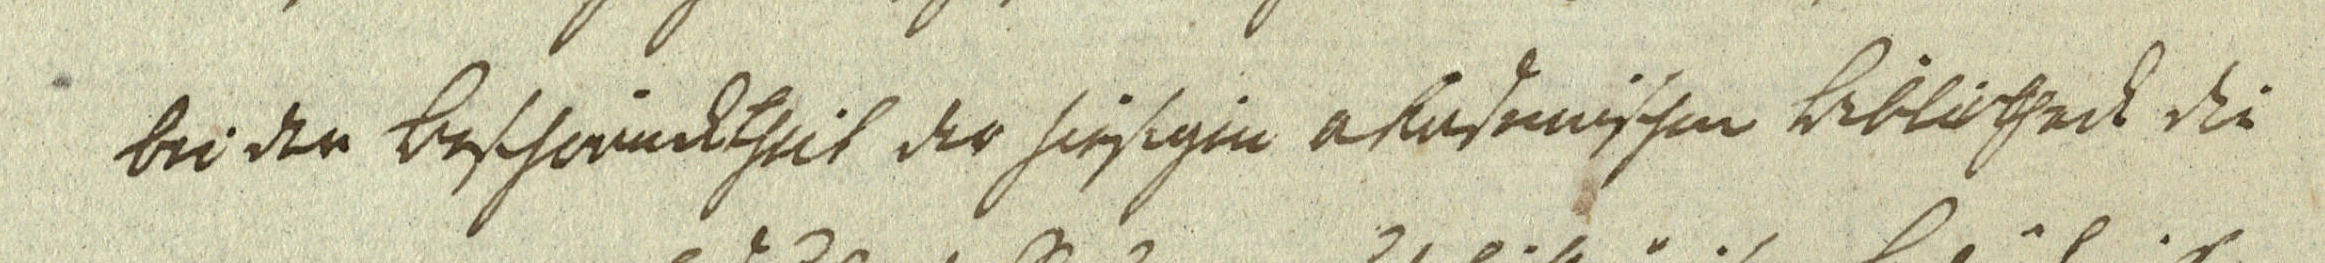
bei der Beschräncktzuit der hiesigen akademischen Bibliothek die
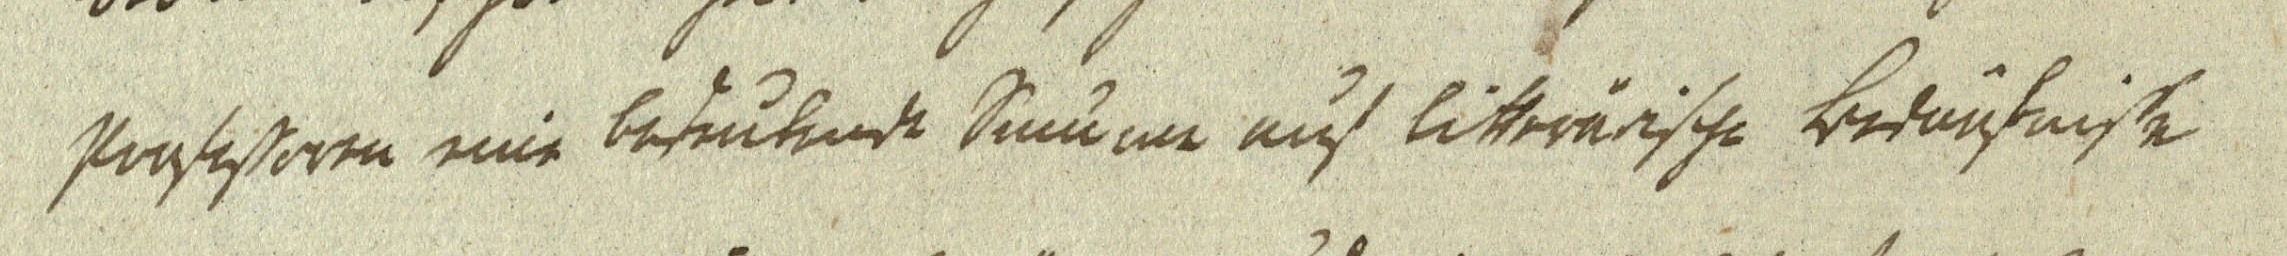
Professoren eine bedeutende Summe auf litterärische Bedürfnisse
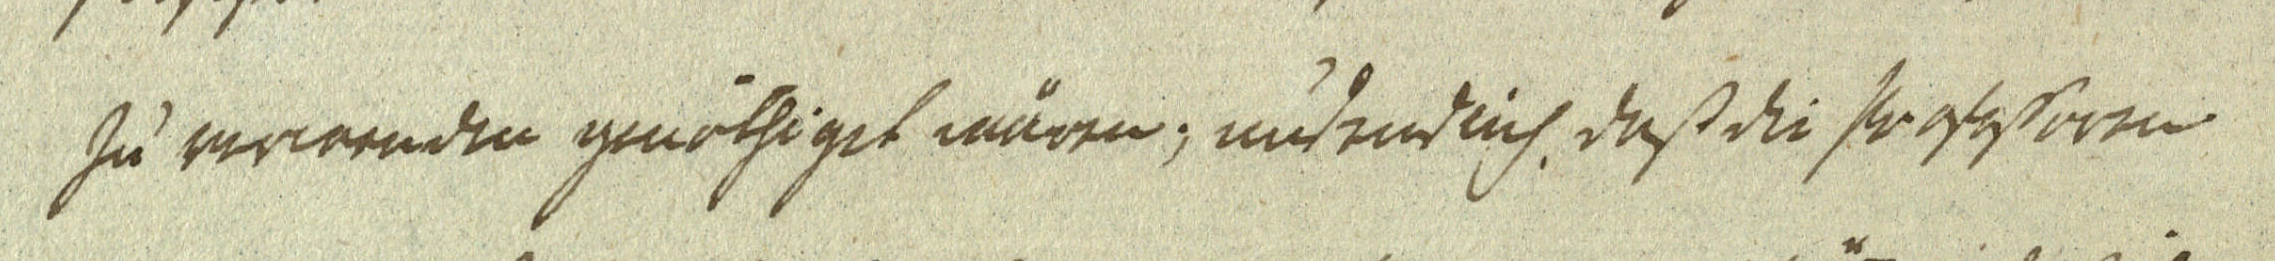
zu verwenden genöthiget wären; und endlich, daß die Professoren
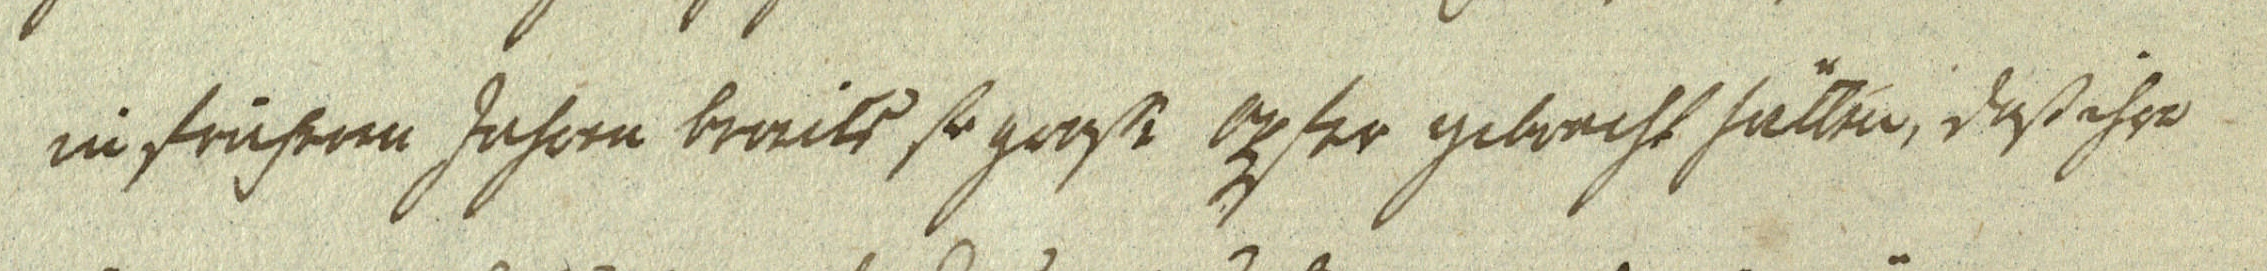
in früheren Jahren bereits so grosse Opfer gebracht hätten, daß ihre
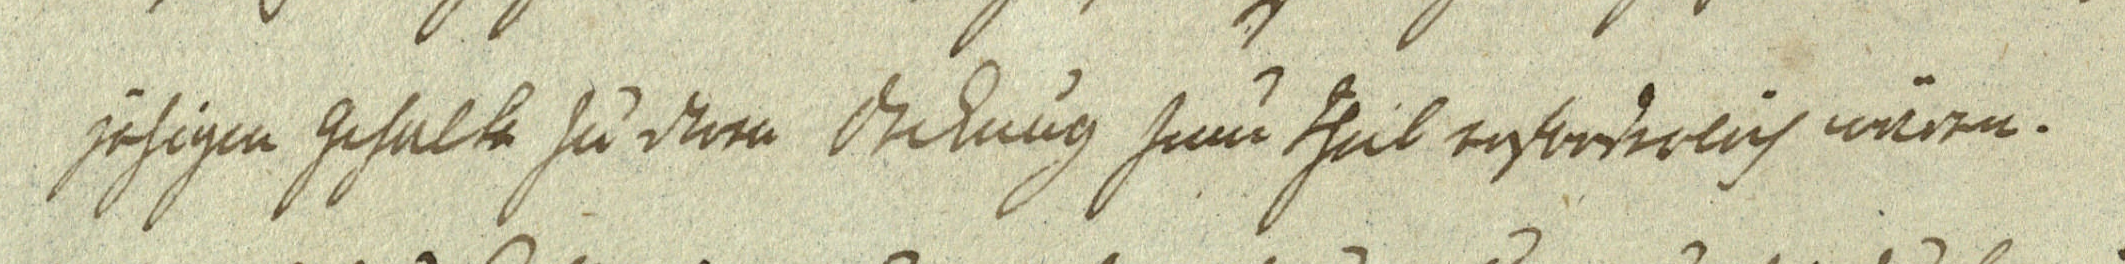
jezigen Gehalte zu deren Deckung zum Theil erforderlich wären.
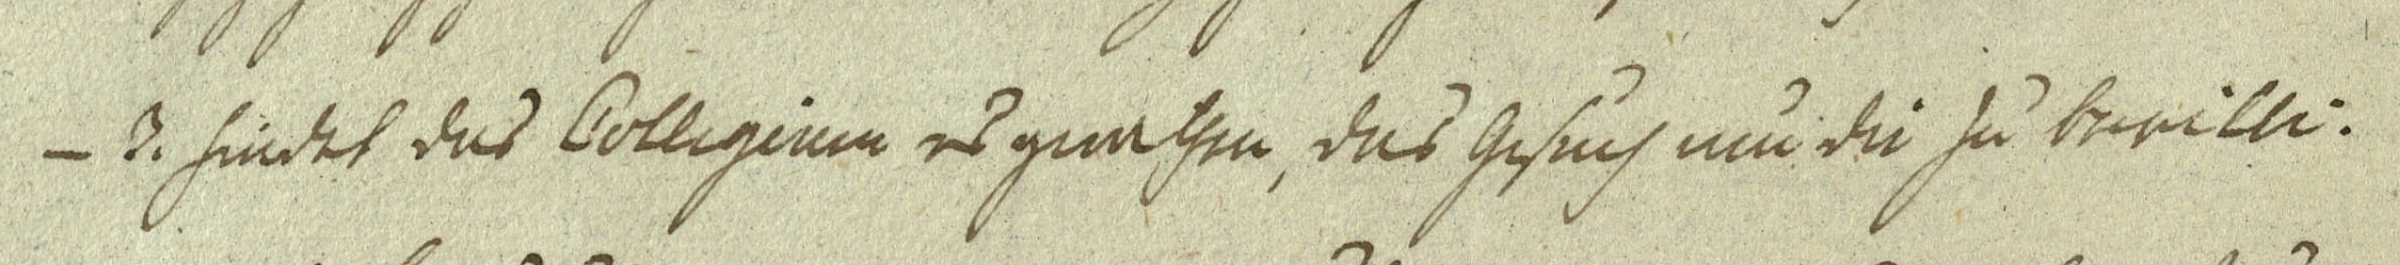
3. findet das Collegium es gerathen, das Gesuch um die zu bewilli¬
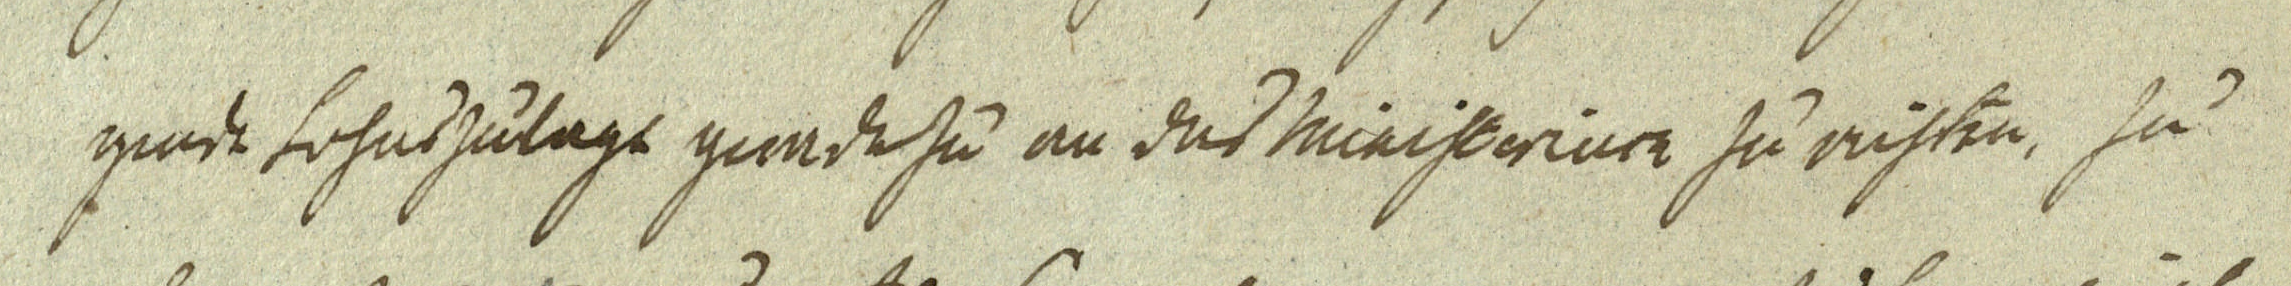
gende Lohnszulage geradezu an das Ministerium zu richten, zu
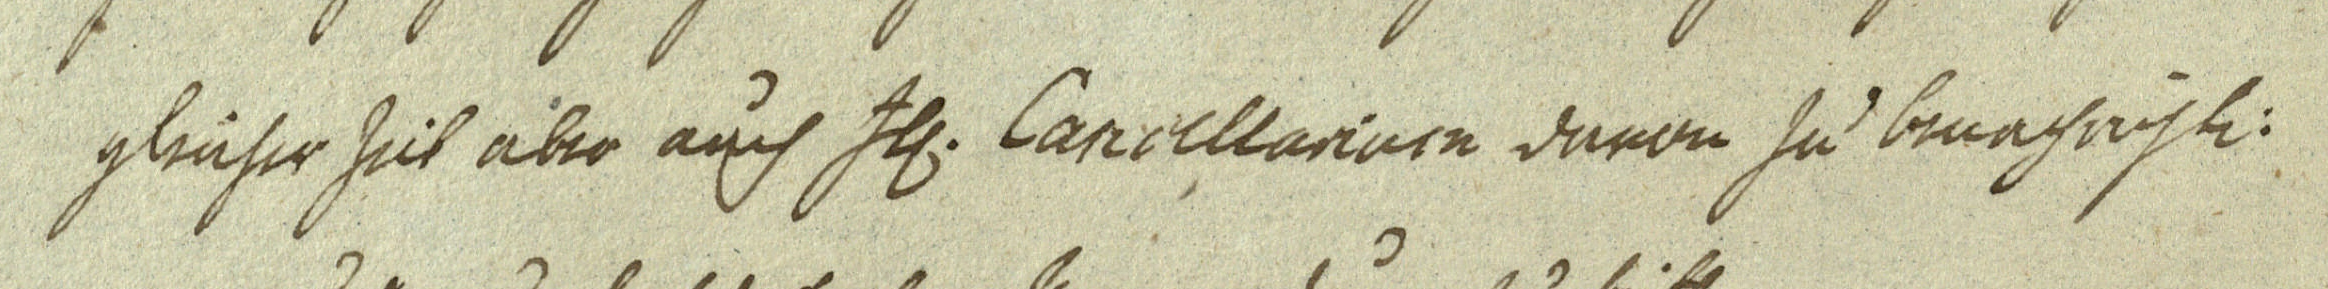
gleicher Zeit aber auch Ill. Cancellarium davon zu benachrichti¬
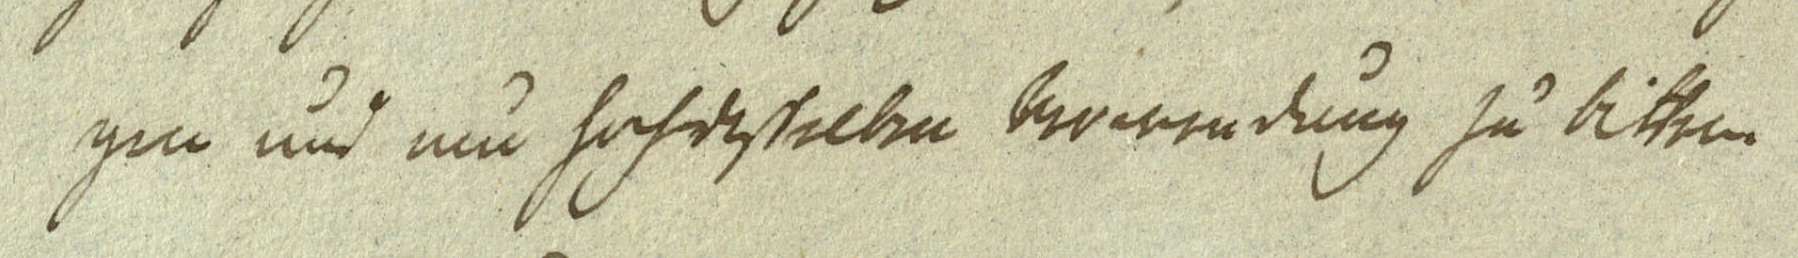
gen und um hochdesselben Verwendung zu bitten.
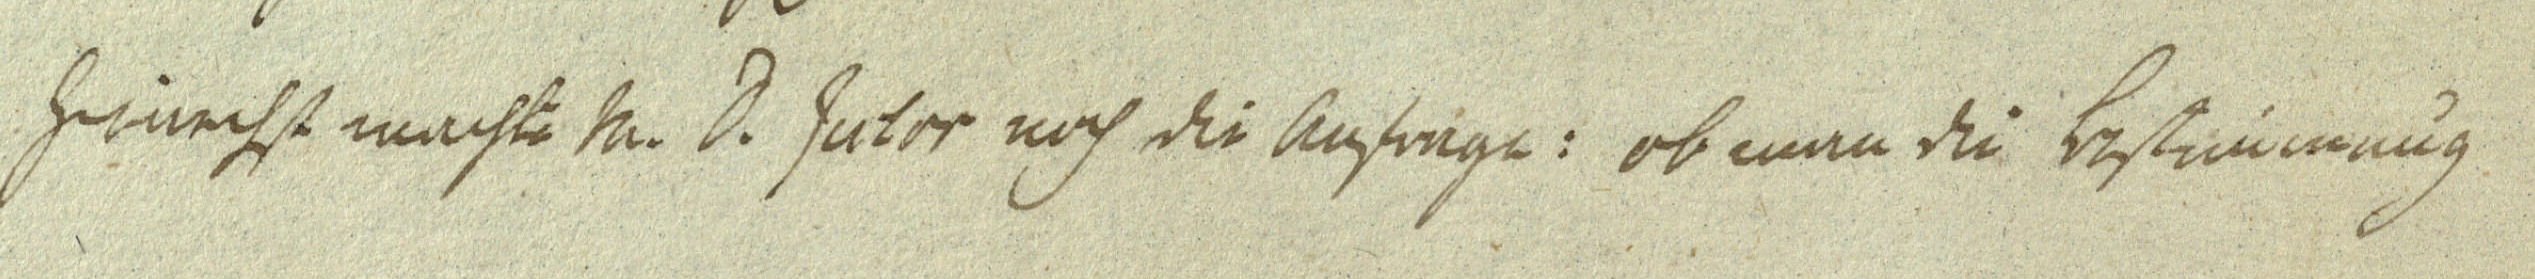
Hienechst machte M. D. Rector noch die Anfrage: ob man die Bestimmung
